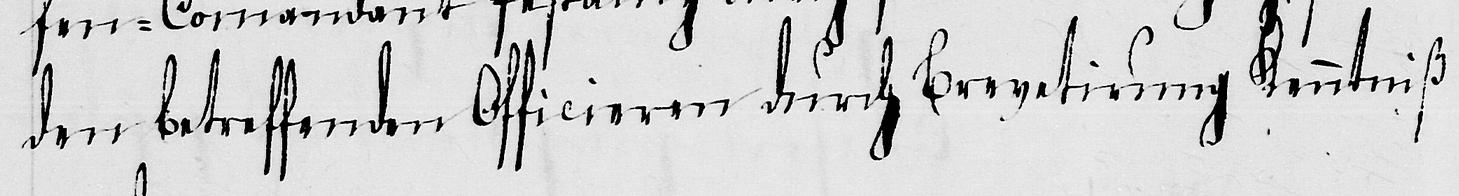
den betreffenden Officieren durch Brevetirung Kenntniß
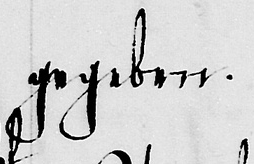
gegeben.
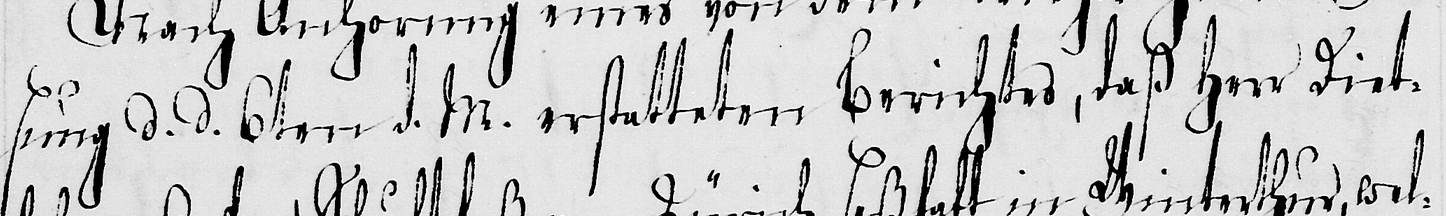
sung d. d. 6ten d. M. erstatteten Berichtes, daß Herr Diet¬
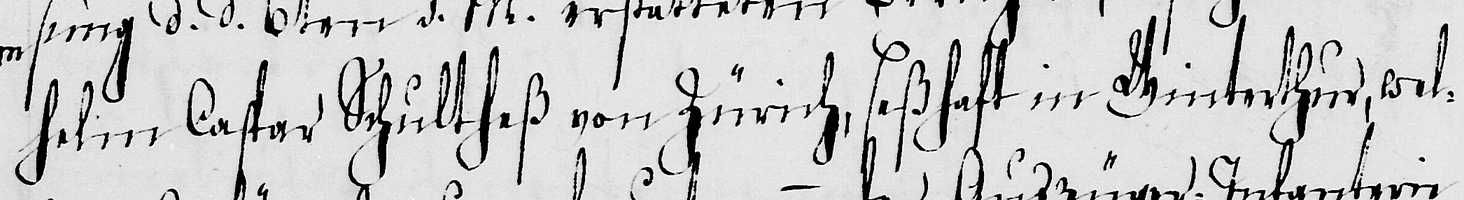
helm Caspar Schultheß von Zürich, seßhaft in Winterthur,
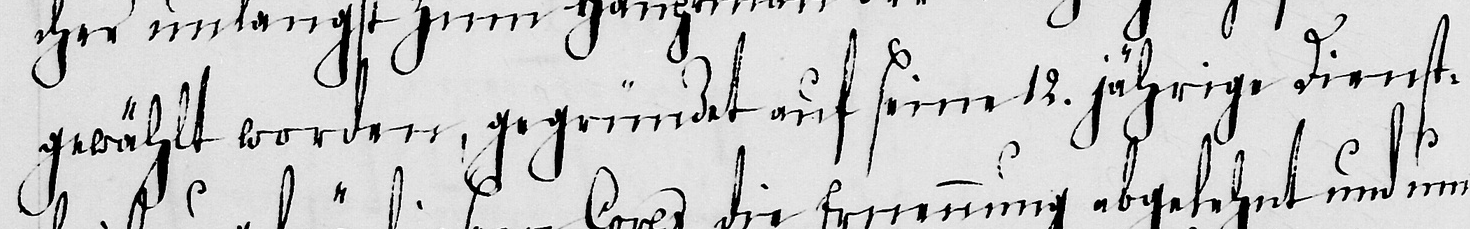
gewählt worden, gegründet auf seine 12. jährige Dienst¬
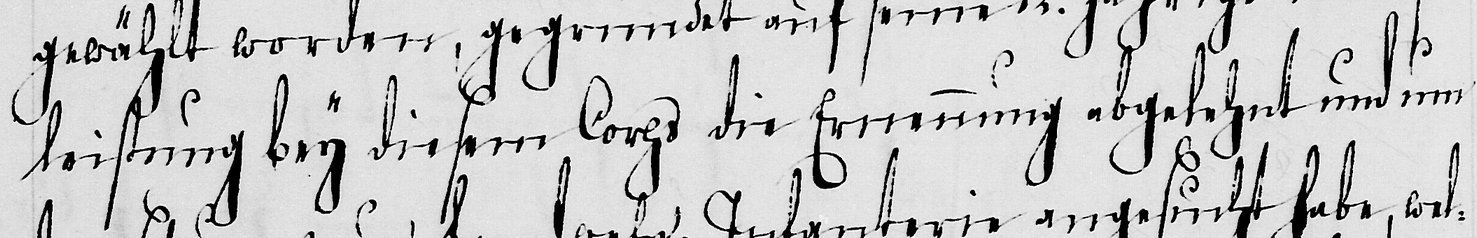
leistung bey diesem Corps die Ernennung abgelehnt und um
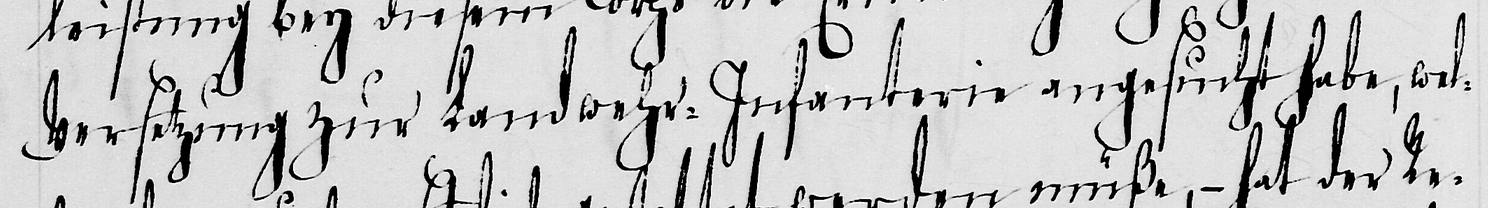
Versetzung zur Landwehr-Infanterie angesucht habe, we¬
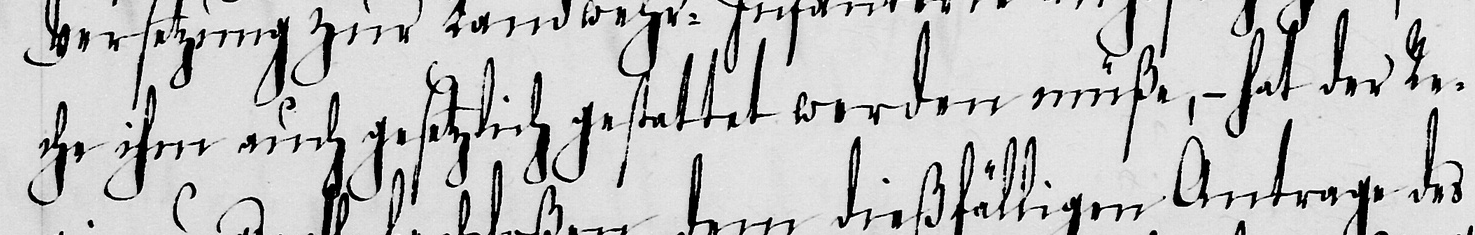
lche ihm auch gesetzlich gestattet werden müße, – hat der Re¬
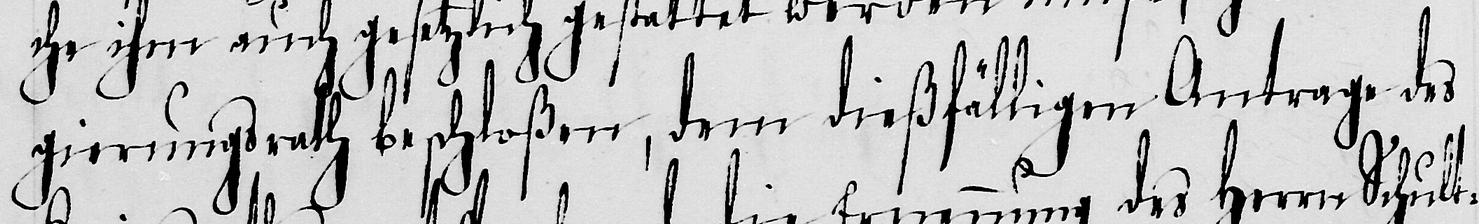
gierungsrath beschloßen, dem dießfälligen Antrage des
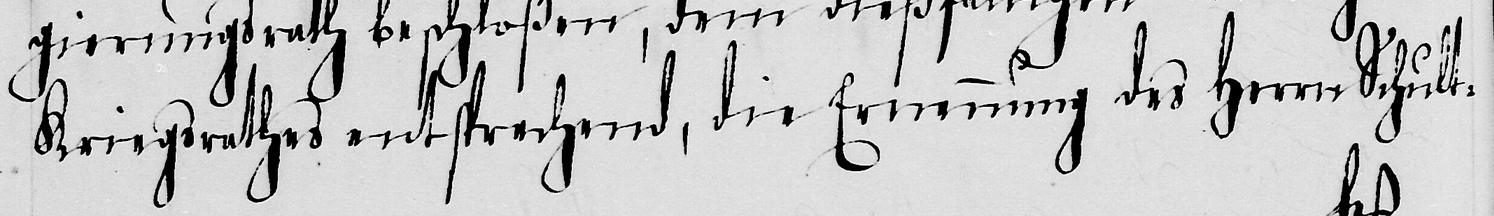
Kriegsrathes entsprechend, die Ernennung des Herrn Schul-
